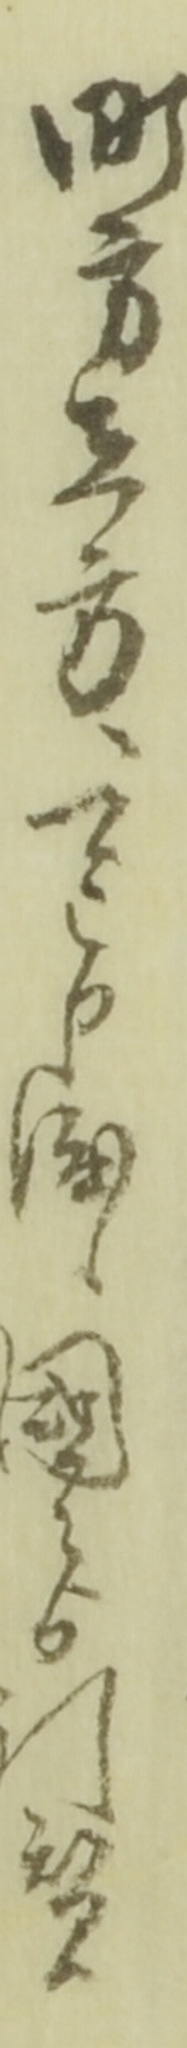町方在方可申触候国之より引替候
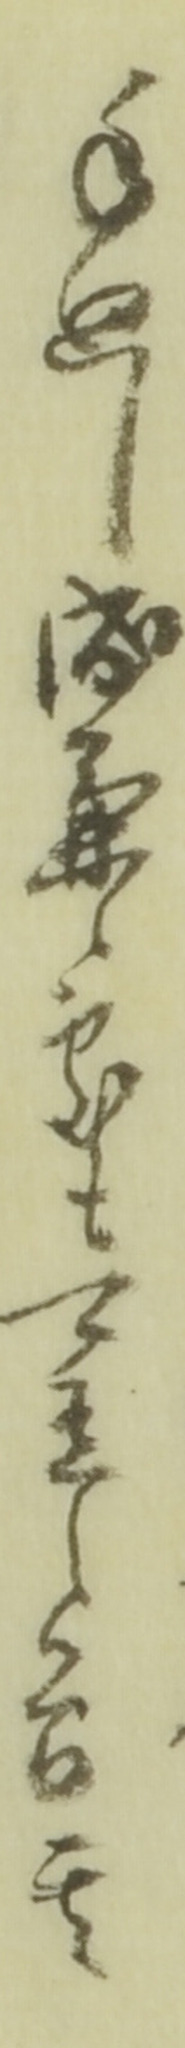手廻し成兼候所も可有之候間其
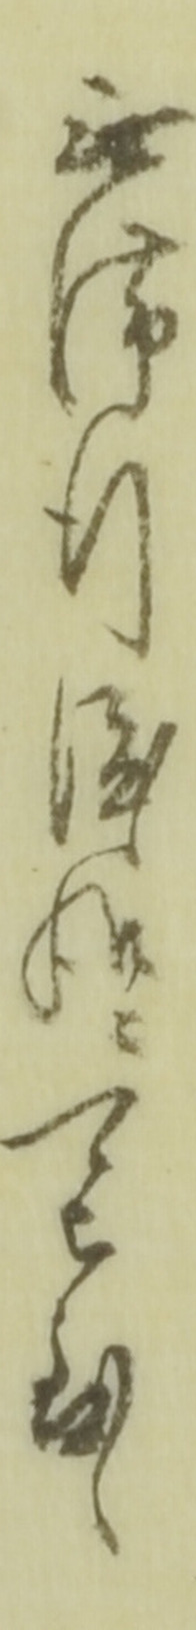無滞行渡候様二可被致候
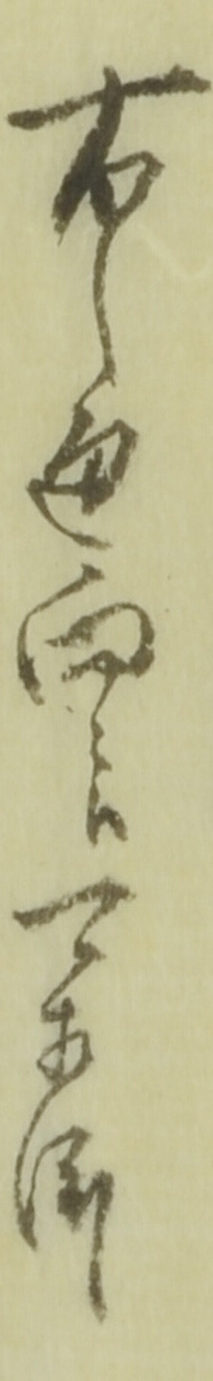右之通向二而可相済候
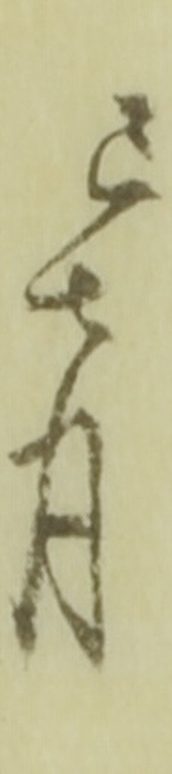巳七月
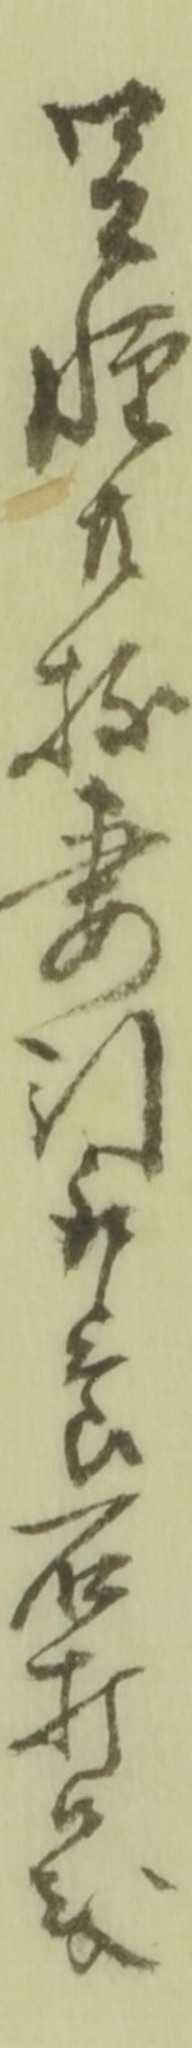足軽共抜妻引取候節石打候義
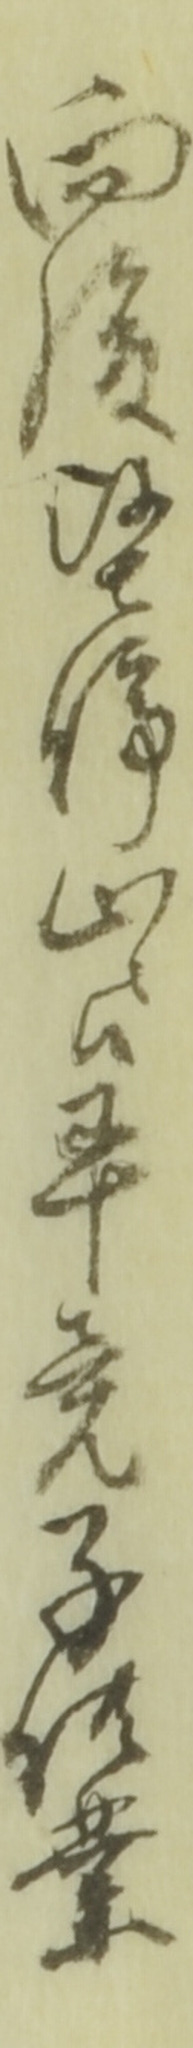向後堅停止候畢竟子供棄
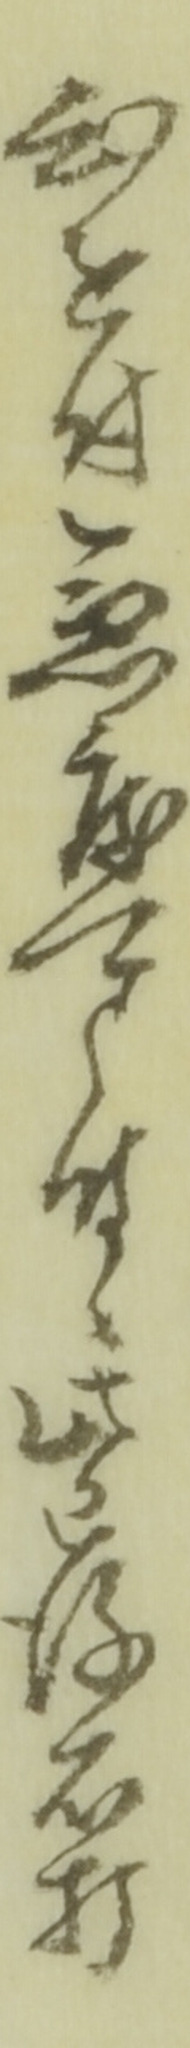気を付急度可申付候此落石打
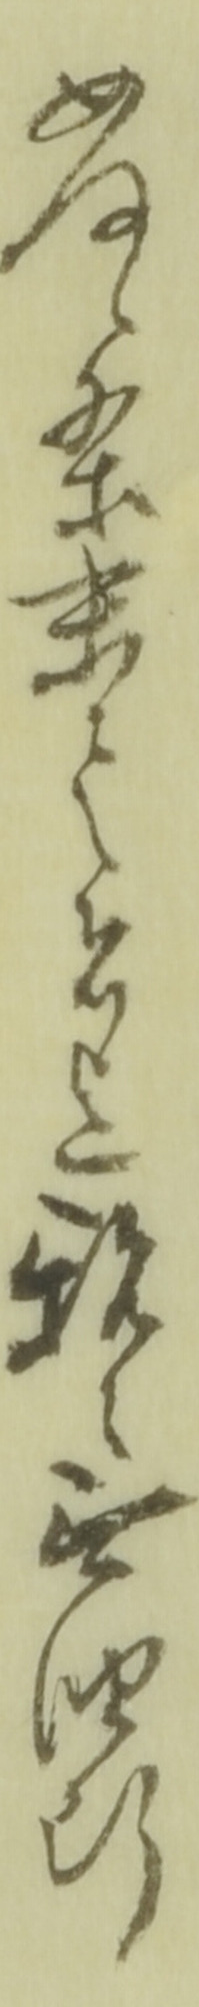如何候条末々之者迄就之無油断
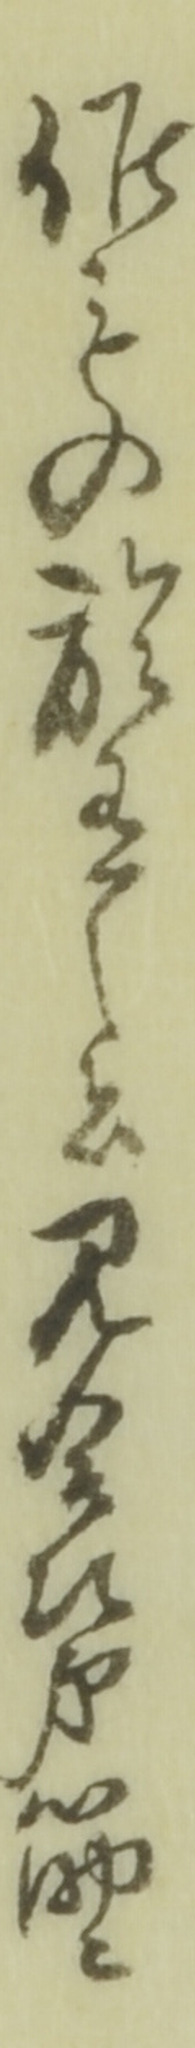候もの族有之者見会次第筋二
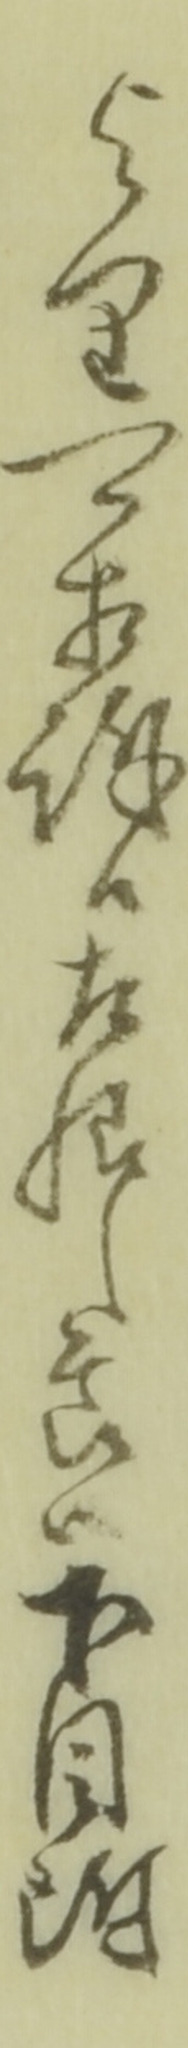より可相訴候左様之節ハ下目附け
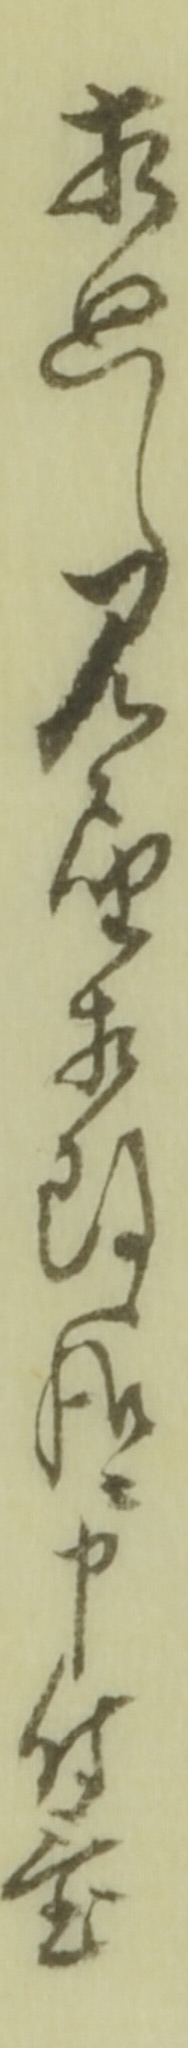相廻し見届相改候様二申付け置き
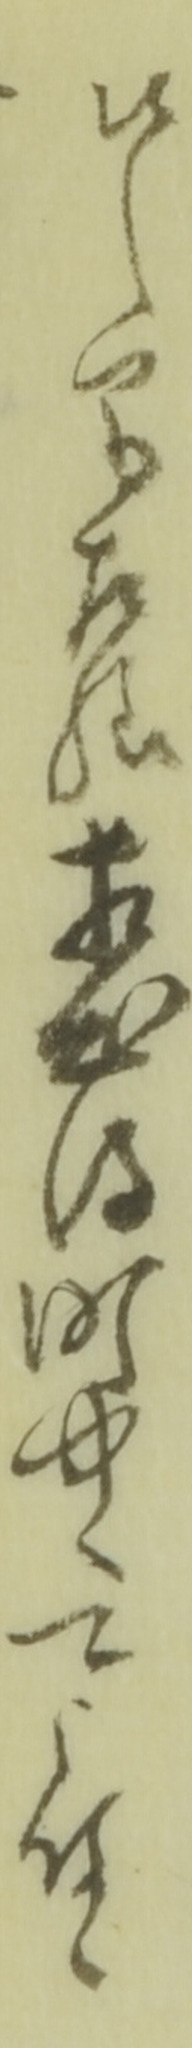候之間左様相心得町中へ可申付候
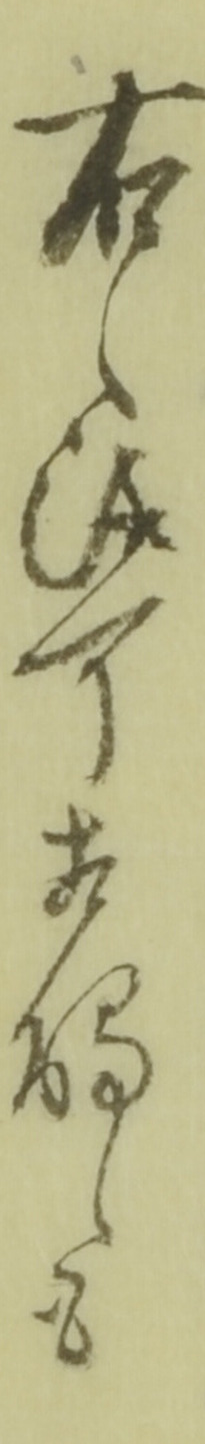右之趣可相触候以上
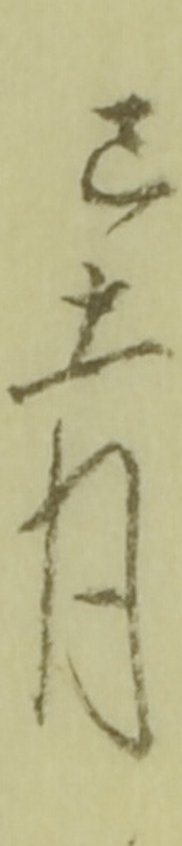巳十一月
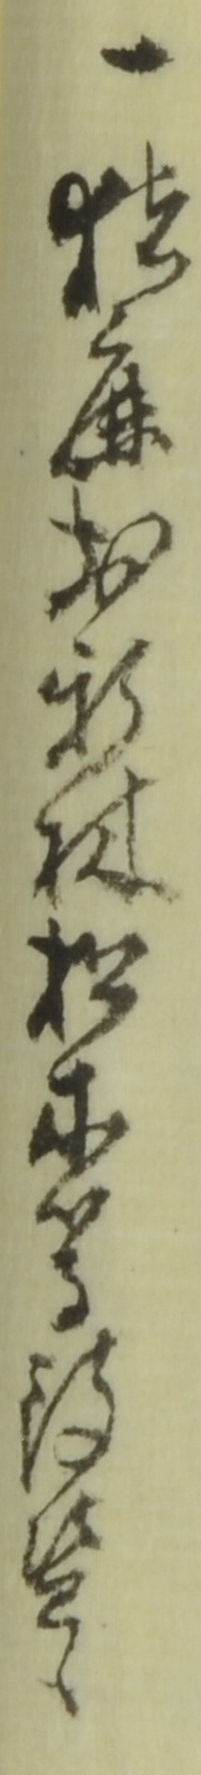一猶廉於新村松木等致盗候
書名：御公儀様御領主様御触書控
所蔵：伊那市立高遠町図書館・合同会社AMANE
